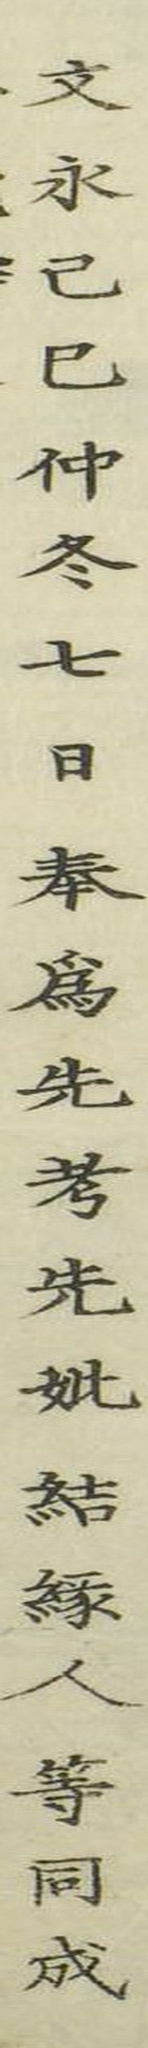文永己巳仲冬七日奉爲先考先妣結緣人等同成

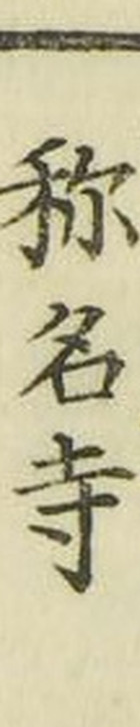称名寺

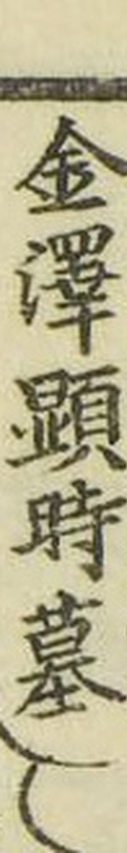金澤顕時墓
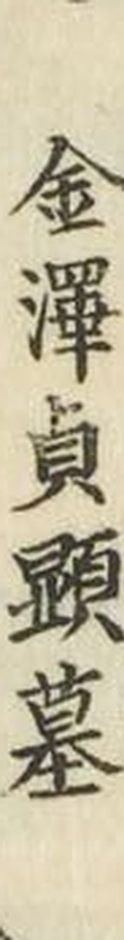金澤貞顕墓
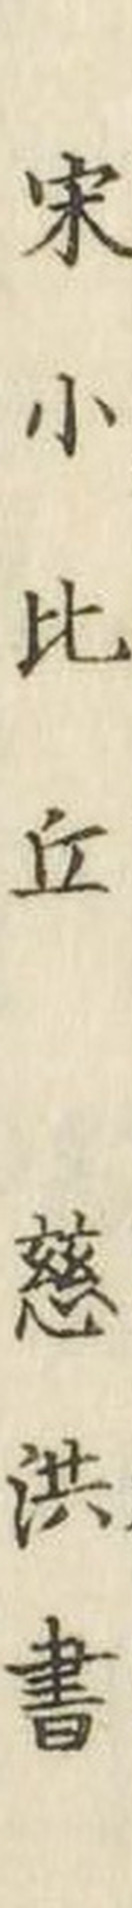宋小比丘慈洪書
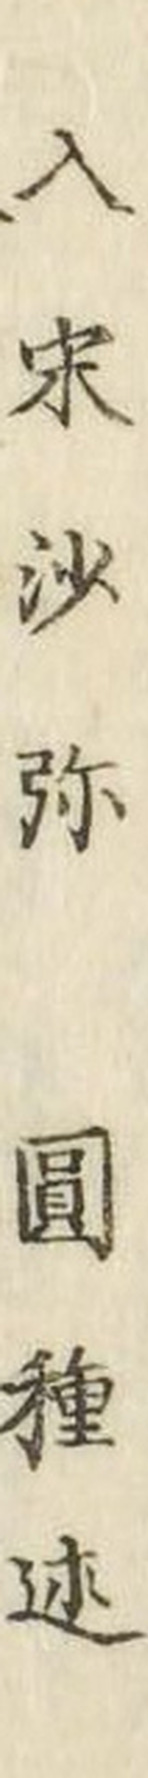入宋沙弥圓種述
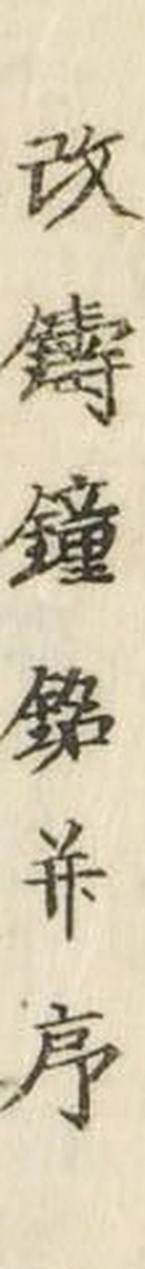改鑄鐘銘并序
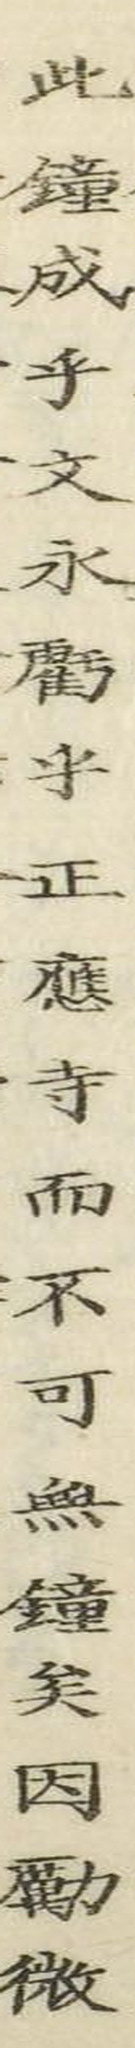此鐘成乎文永虧乎正應寺而不可無鐘矣因勵微
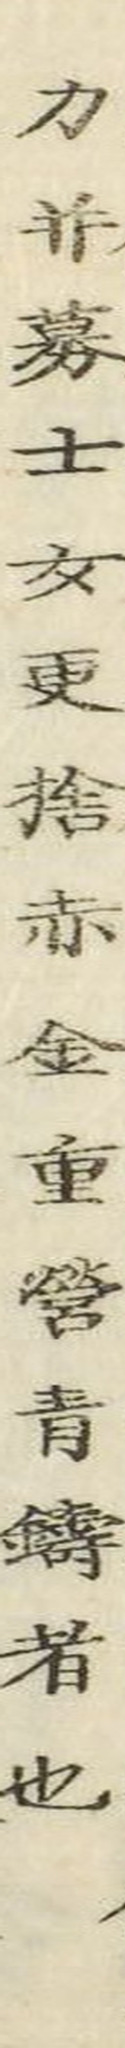力并募士女更捨赤金重營青鑄者也
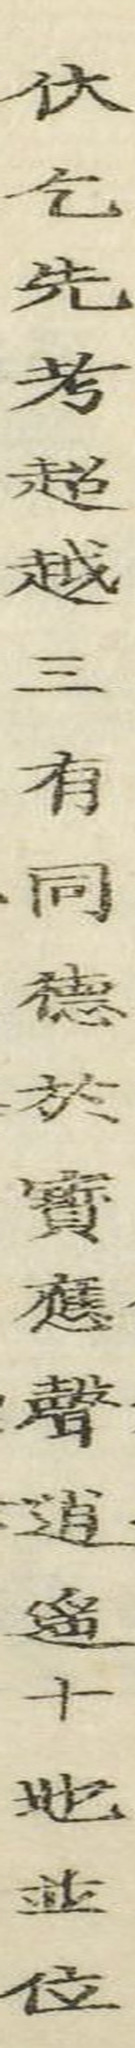伏乞先考超越三有同德於寳應聲逍遥十地並位
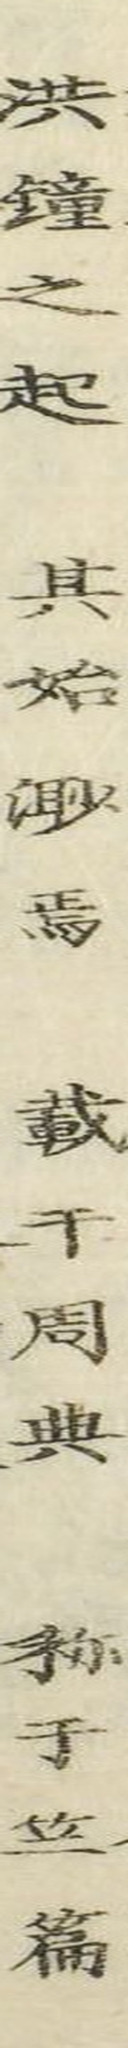洪鐘之起其始渺焉載于周典称于竺篇
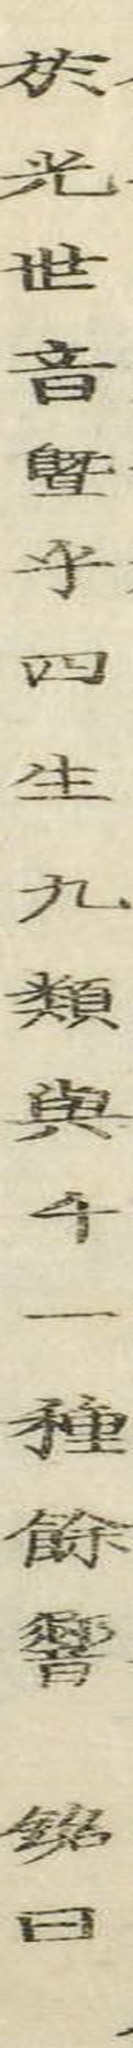於光世音曁乎四生九類與千一種餘響銘曰
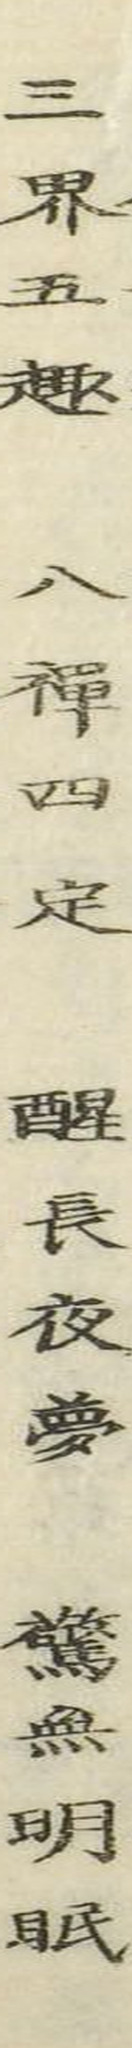三界五趣八禪四定醒長夜夢驚無明眠
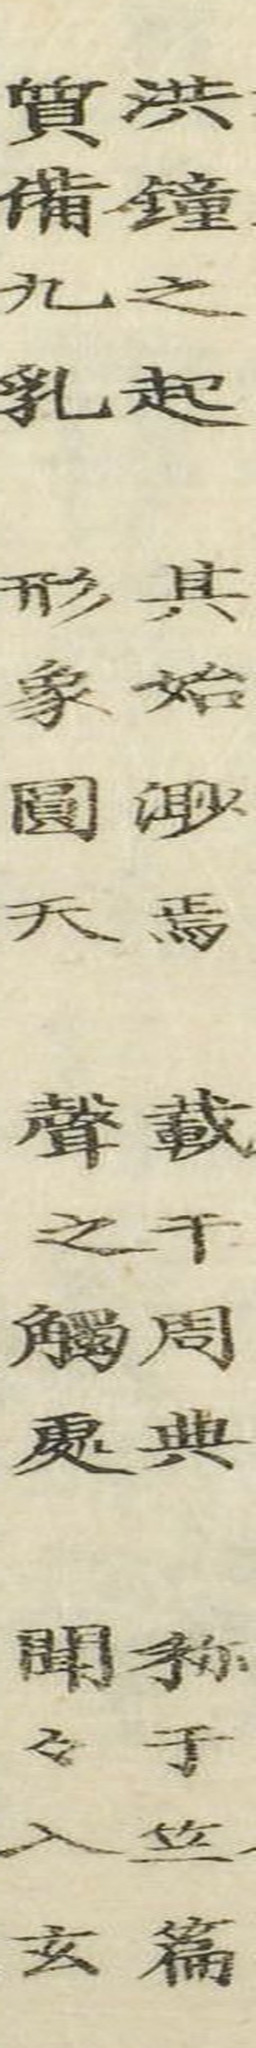質備九乳形象圓天聲之觸處聞々入玄
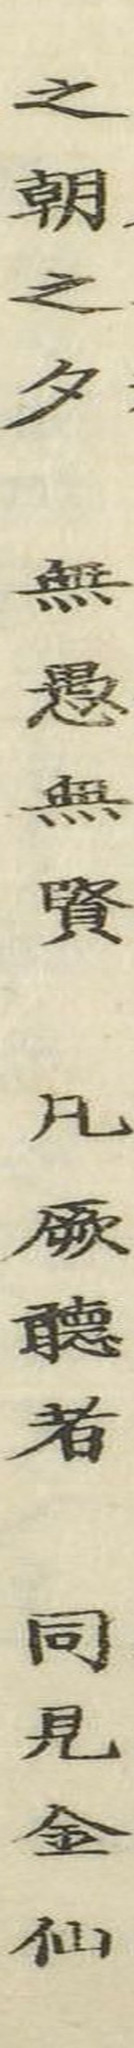之朝之夕無愚無賢凡厥聽者同見金仙
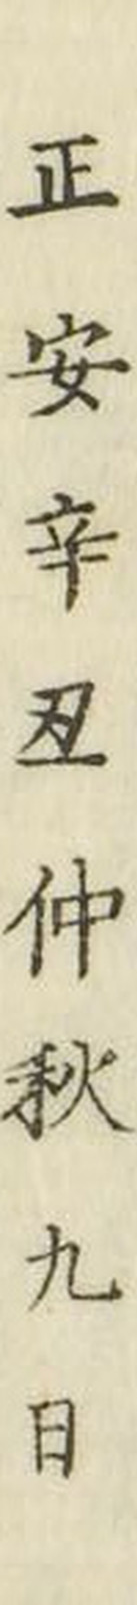正安辛丑仲秋九日
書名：江戸名所図会 20巻 巻之6
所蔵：東京学芸大学教育コンテンツアーカイブ
